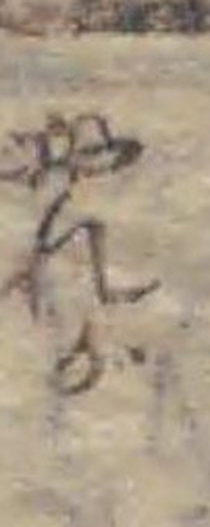おれが
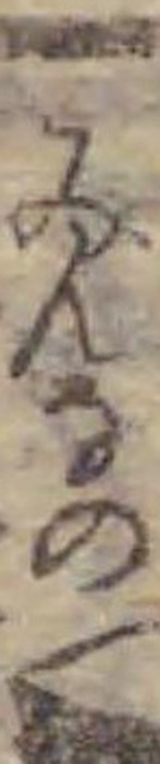みんなの
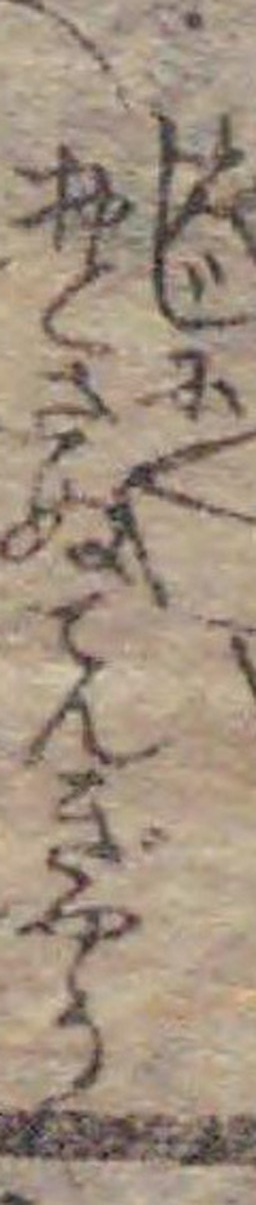おとさぬてんぎゃう
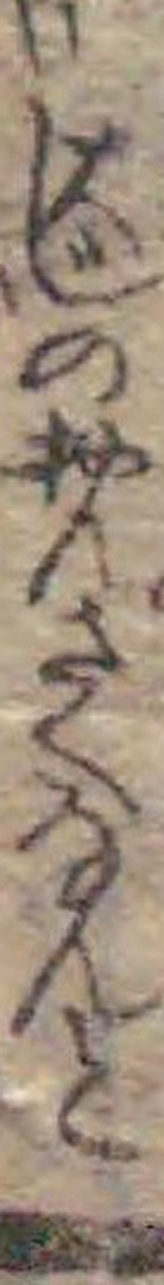大じのおんさくなんと
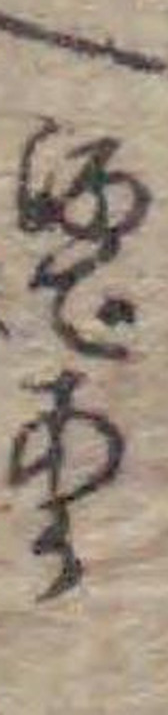酒であか
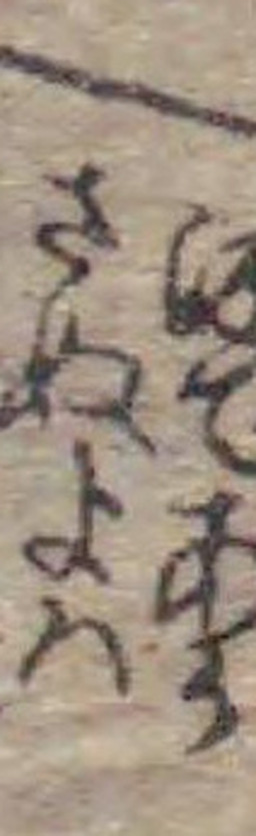さぬよは
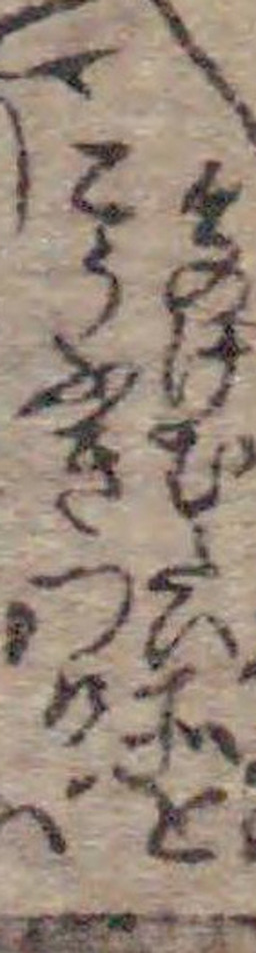こうふきつければ
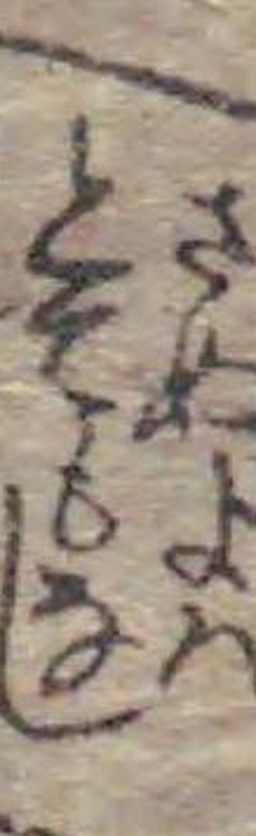とてもなし
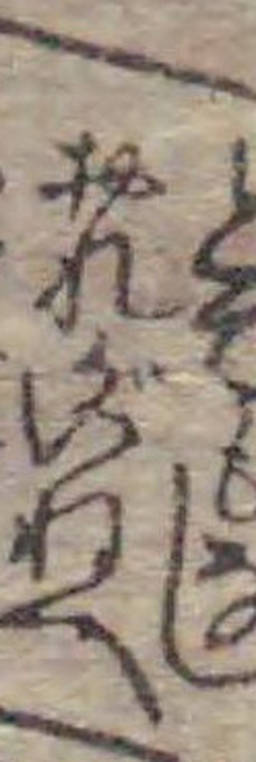おれがいねへ
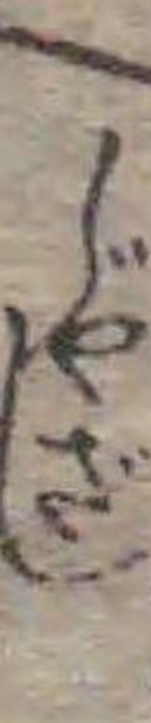じやざし
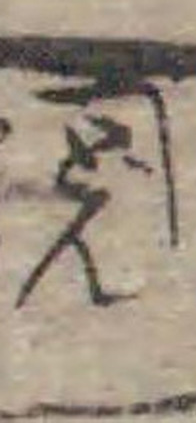〽どん
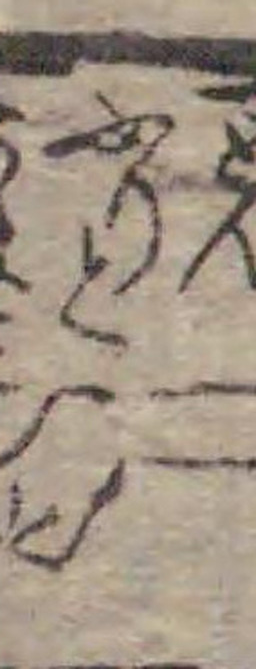ぶりと
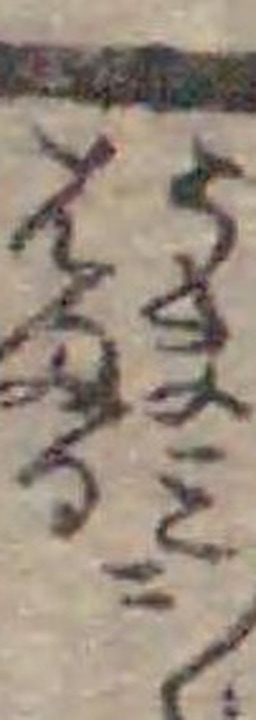はまる
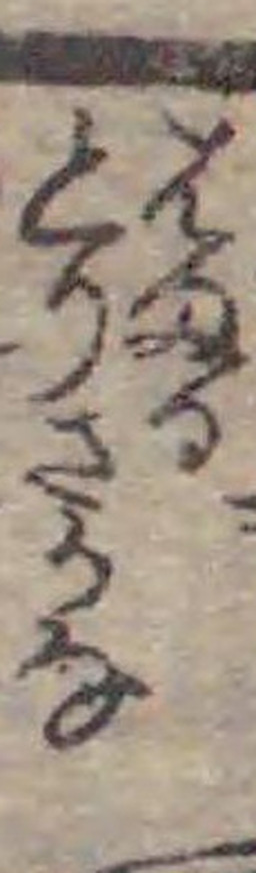とりさかな
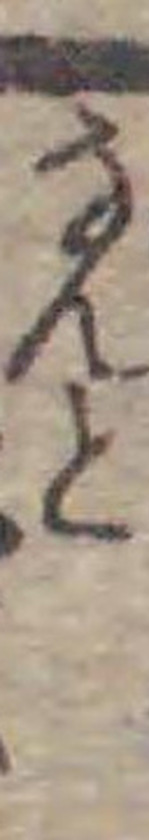なんと
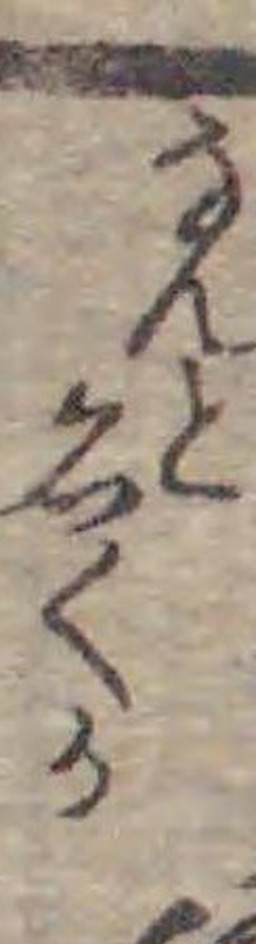名くか
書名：歌の化物一寺再興 : 2巻
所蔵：国立国会図書館 National Diet Library, JAPAN
